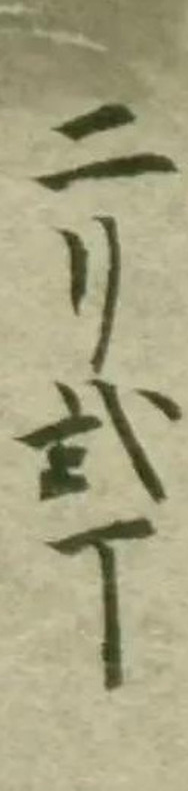二リ弐丁
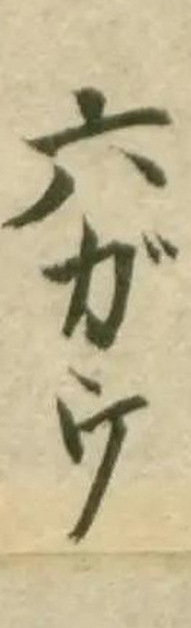六ガウ
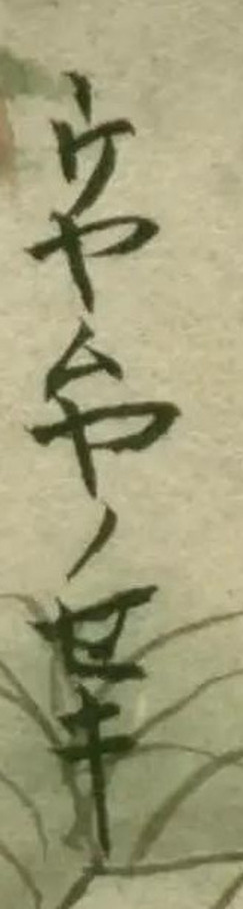ウヤムヤノセキ
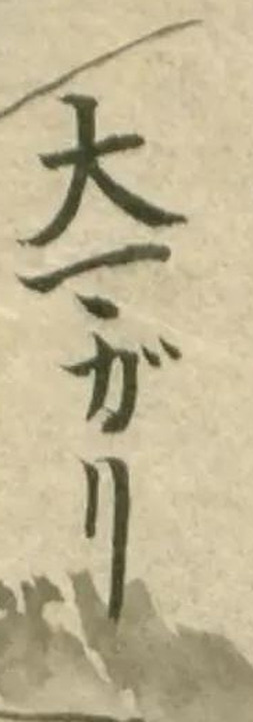大マガリ
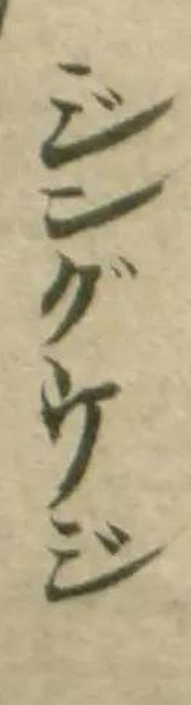ジングウジ

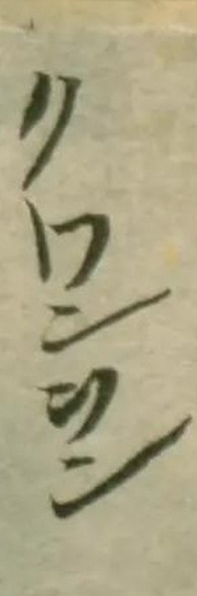クワンヲン
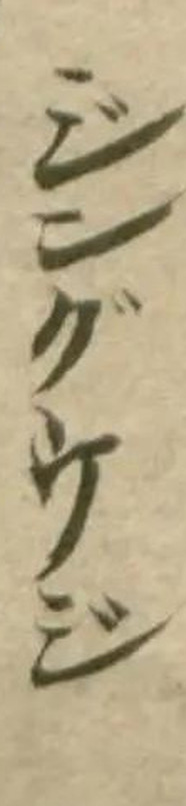ジングウジ
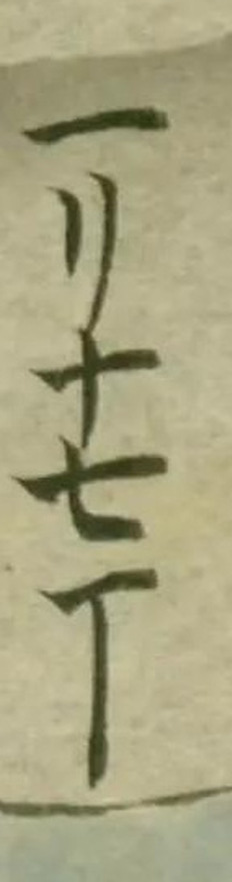一リ十七丁
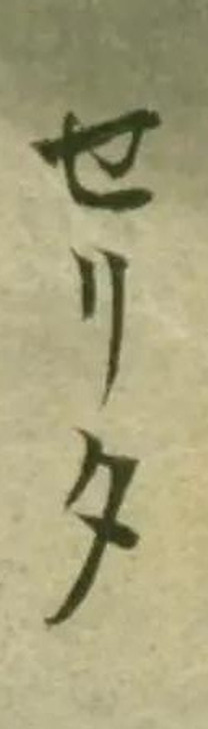セリタ
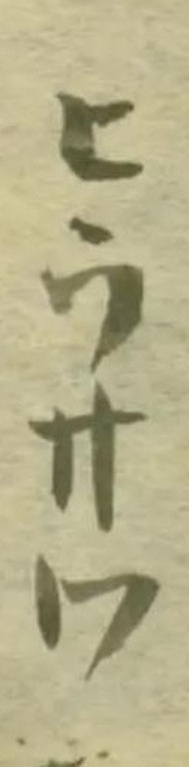ヒラサワ
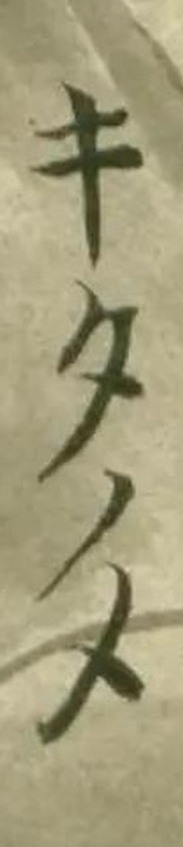キタノメ
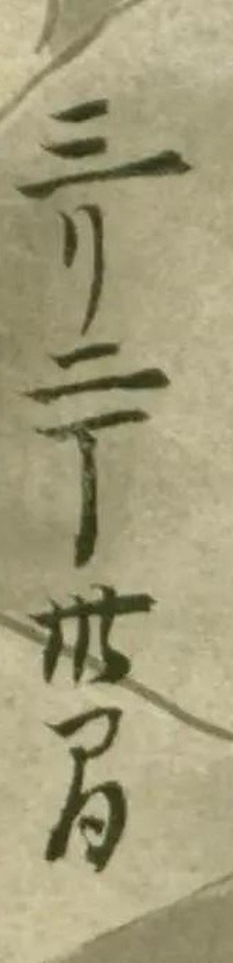三リ二丁卅間
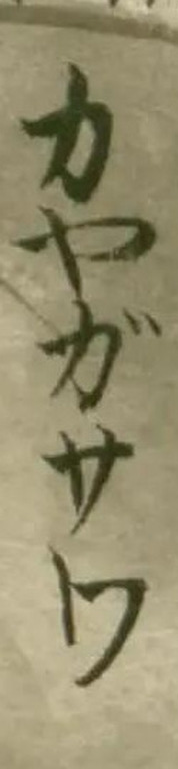カヤガサワ
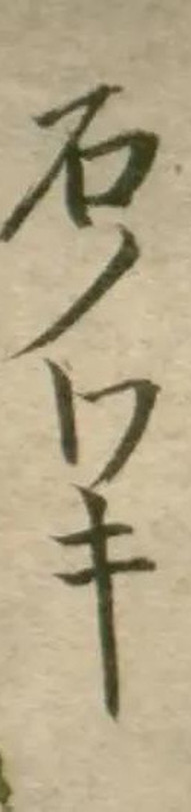石ノワキ

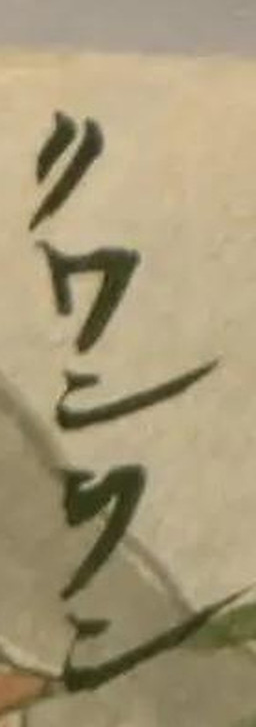クワンヲン
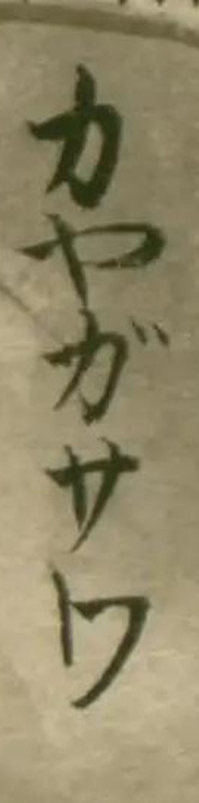カヤガサワ
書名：江戸より奥州津輕迄道筋之圖
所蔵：国立国会図書館 National Diet Library, JAPAN
